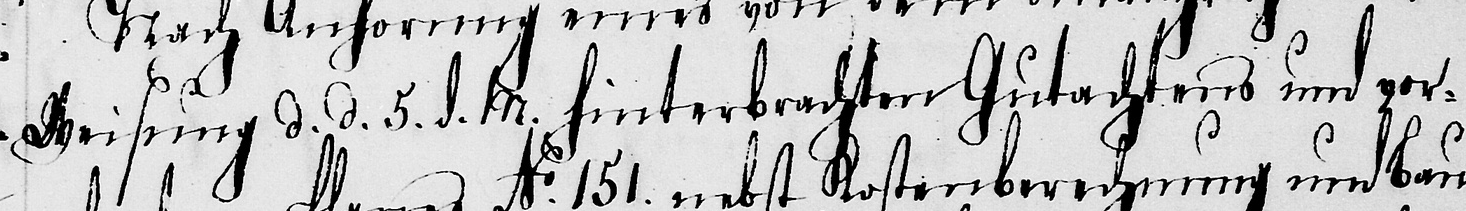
Weisung d. d. 5. d. M. hinterbrachten Gutachtens und vor¬
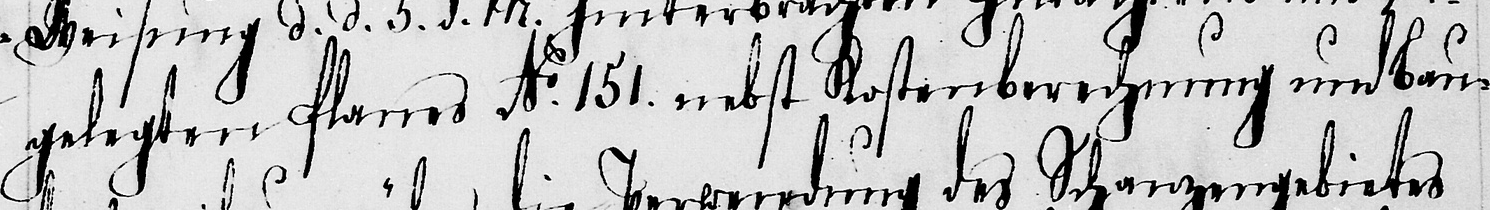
gelegten Planes No. 151. nebst Kostenberechnung und Bau¬
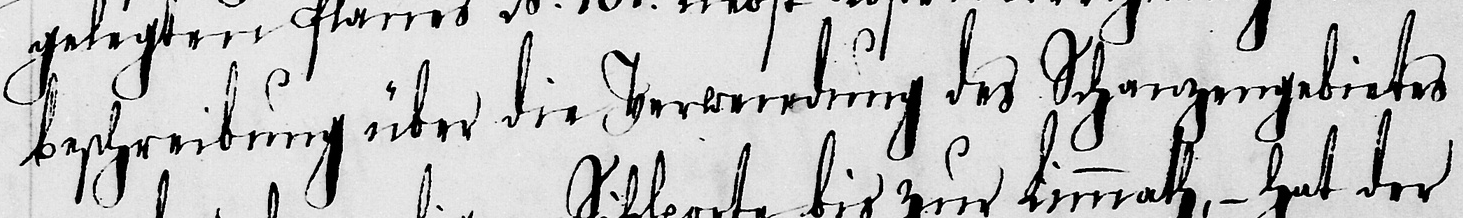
beschreibung über die Verwendung des Schanzengebietes
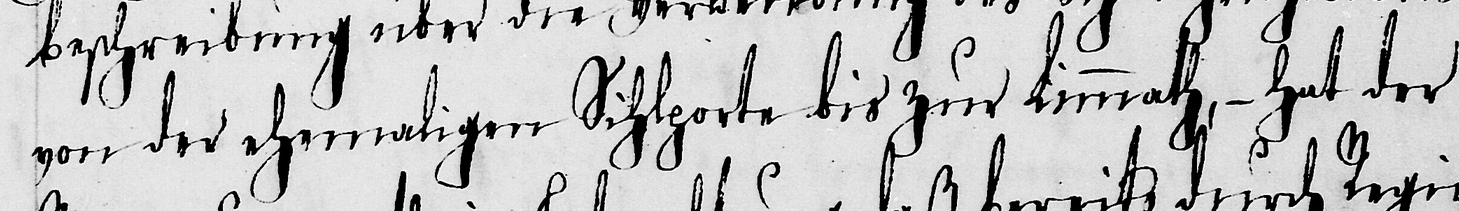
von der ehemaligen Sihlporte bis zur Limmath, – hat der
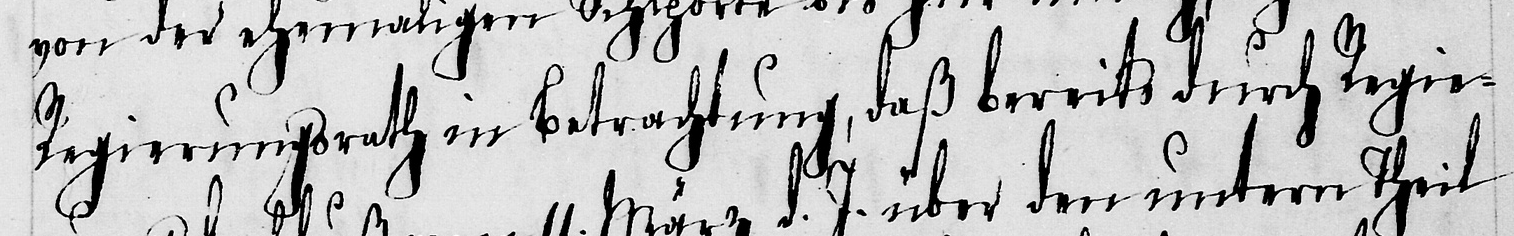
Regierungsrath in Betrachtung, daß bereits durch Regie¬
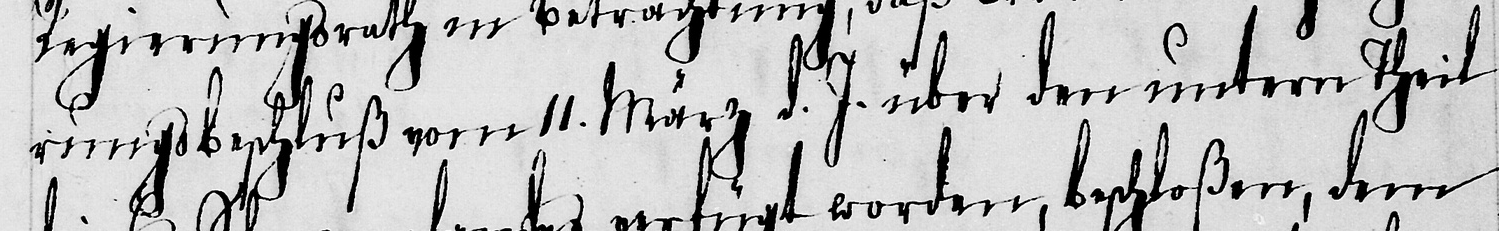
rungsbeschluß vom 11. März d. J. über den untern Theil
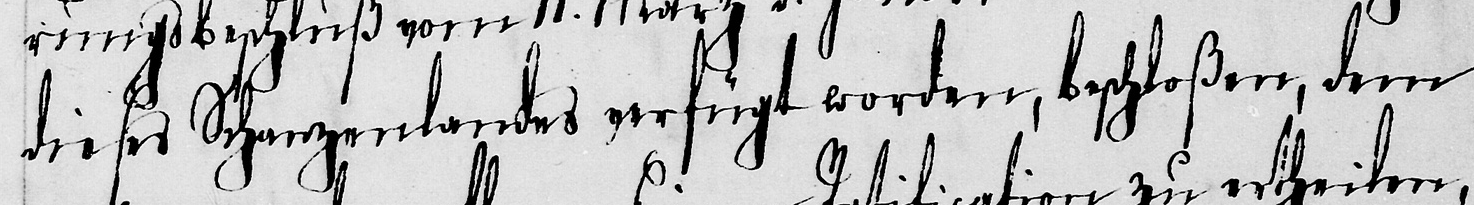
dieses Schanzenlandes verfügt worden, beschloßen, dem
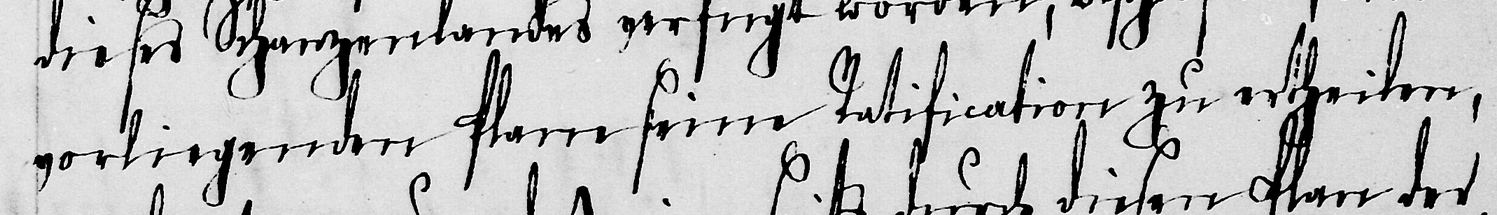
vorliegenden Plane seine Ratification zu ertheilen,
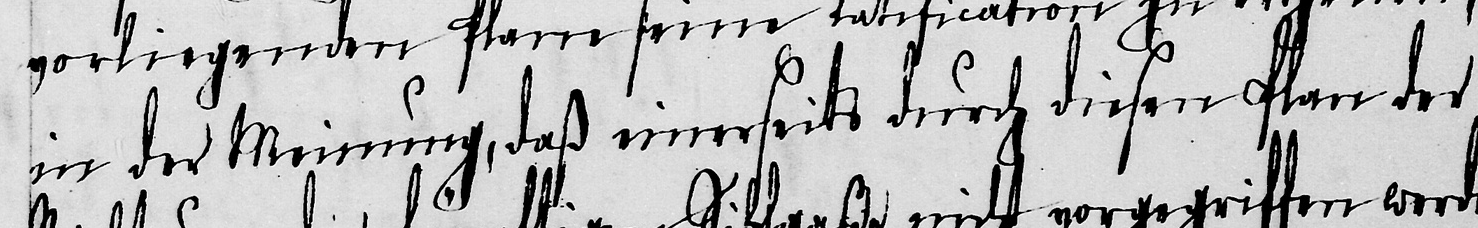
in der Meinung, daß einerseits durch diesen Plan der
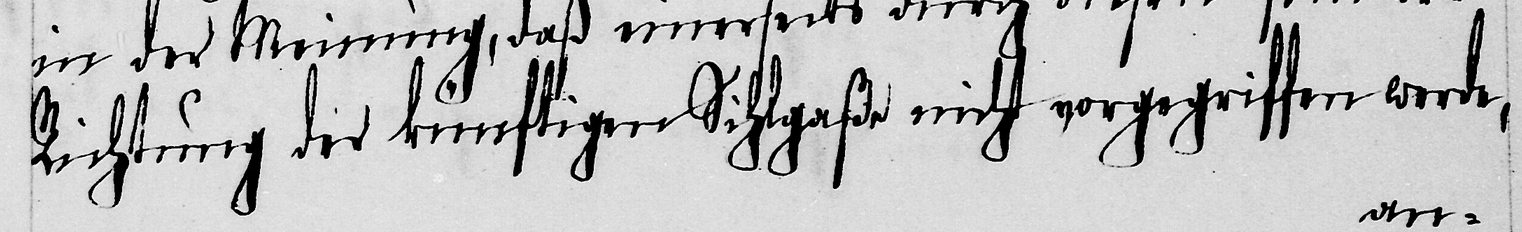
Richtung der künftigen Sihlgaße nicht vorgegriffen werde,
